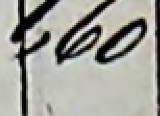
1,60
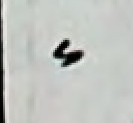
„
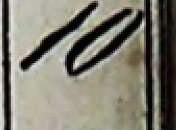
10
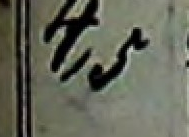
4,5
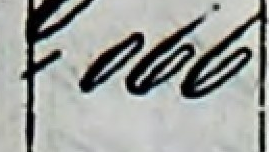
0,066
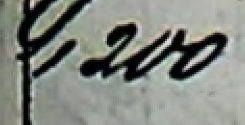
0,200
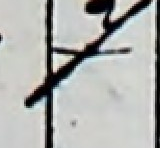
7
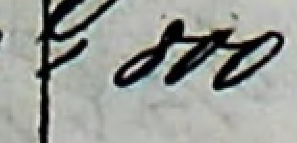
0,800
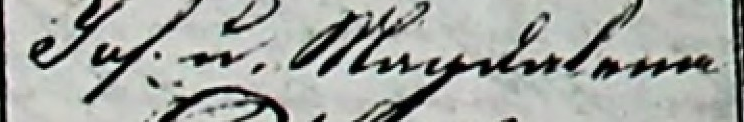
Jos. u. Magdalena
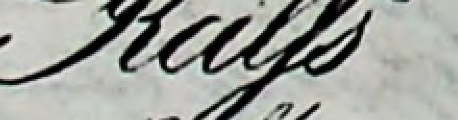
Kalss
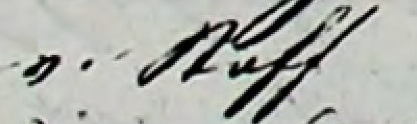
v. Stoff
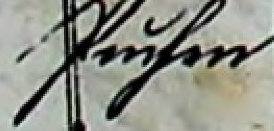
Puchen
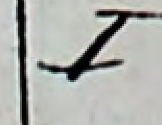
I
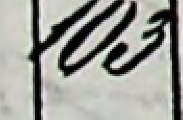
103
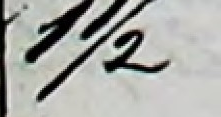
1 ½
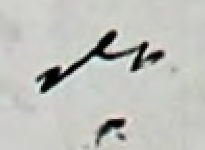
do
